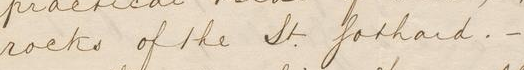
rocks of the St. Gothard. –
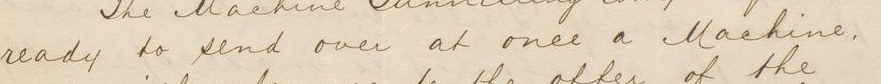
ready to send over at once a Machine,
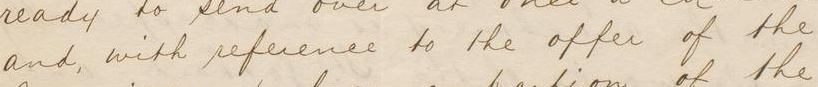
and, with reference to the offer of the
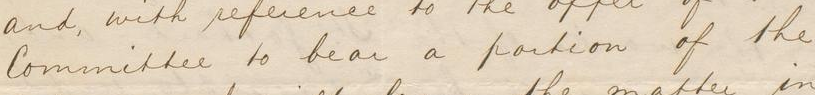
Committee to bear a portion of the
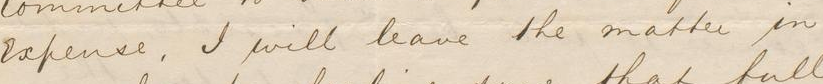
expense, I will leave the matter in
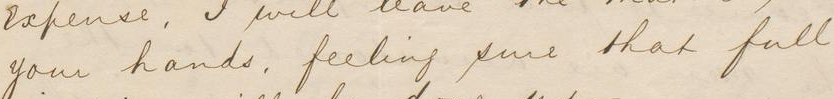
your hands, feeling sure that full
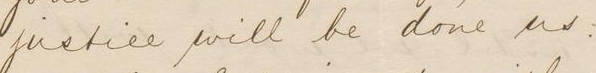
justice will be done us. –
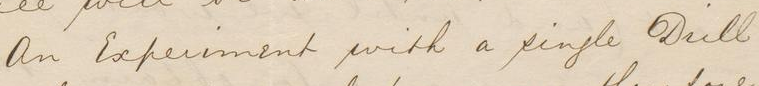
An Experiment with a single Drill
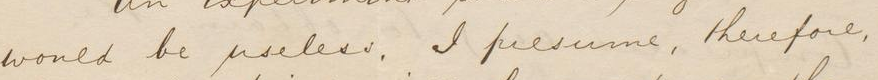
would be useless, I presume, therefore,
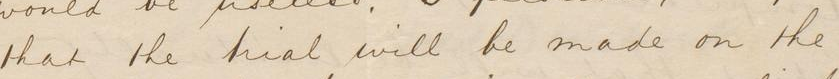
that the trial will be made on the
